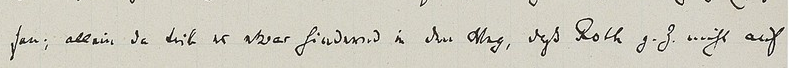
fen; allein da tritt es etwas hindernd in den Weg, daß Roth z. Z. nicht auf
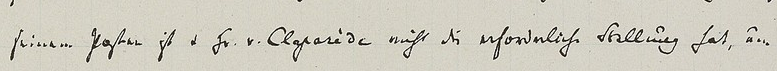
seinem Posten ist & Hr. v. Claparède nicht die erforderliche Stellung hat, um
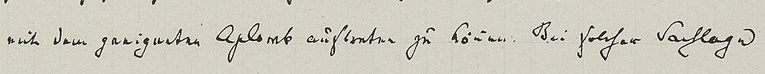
mit dem geeigneten Aplomb auftreten zu können. Bei solcher Sachlage
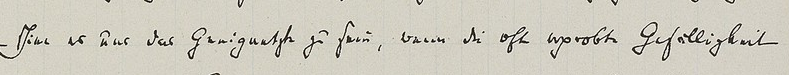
schien es uns das Geeignetste zu sein, wenn die oft erprobte Gefälligkeit
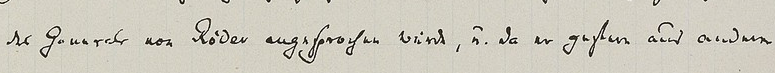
des Generals von Röder angesprochen würde, u. da er gestern aus anderer
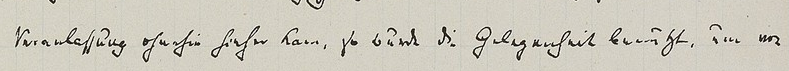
Veranlassung ohnehin hieher kam, so wurde die Gelegenheit benutzt, um von
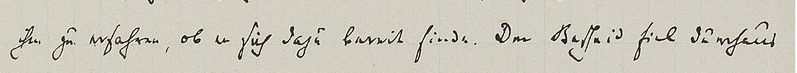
ihm zu erfahren, ob er sich dazu bereit finde. Der Bescheid fiel durchaus
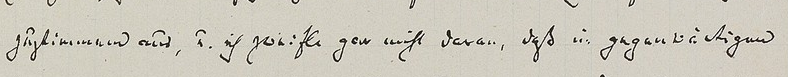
zustimmend aus, u. ich zweifle gar nicht daran, daß im gegenwärtigen
